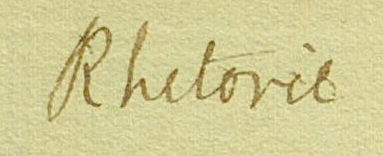Rhetoric
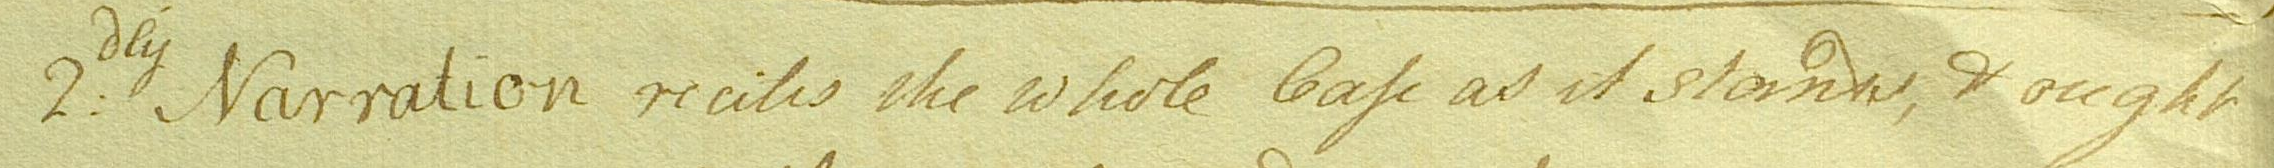2^dly: Narration recites the whole Case as it stands, & ought
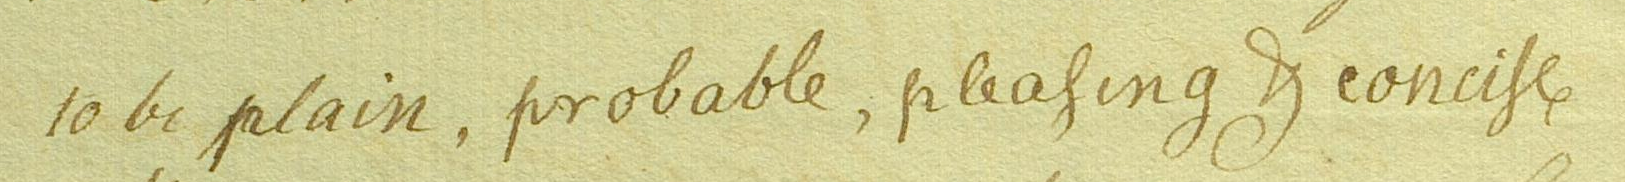to be plain, probable, pleasing & concise
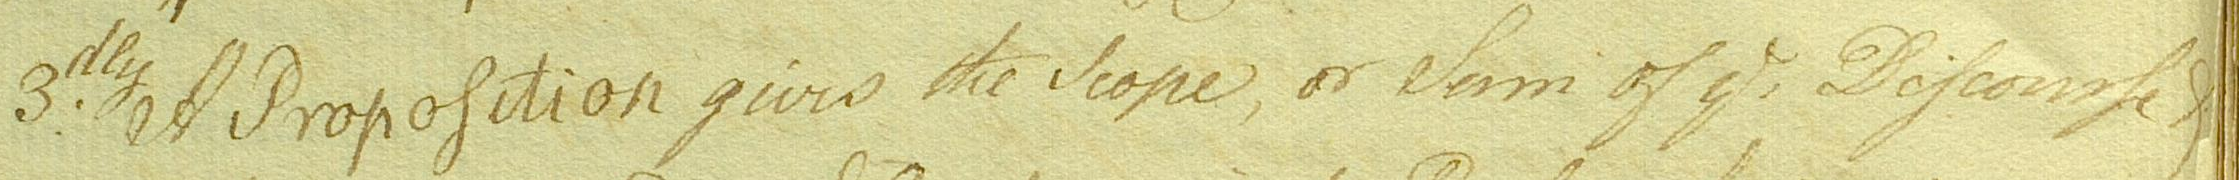3^dly: A Proposition gives the Scope, or Serm of y^e Discourse &
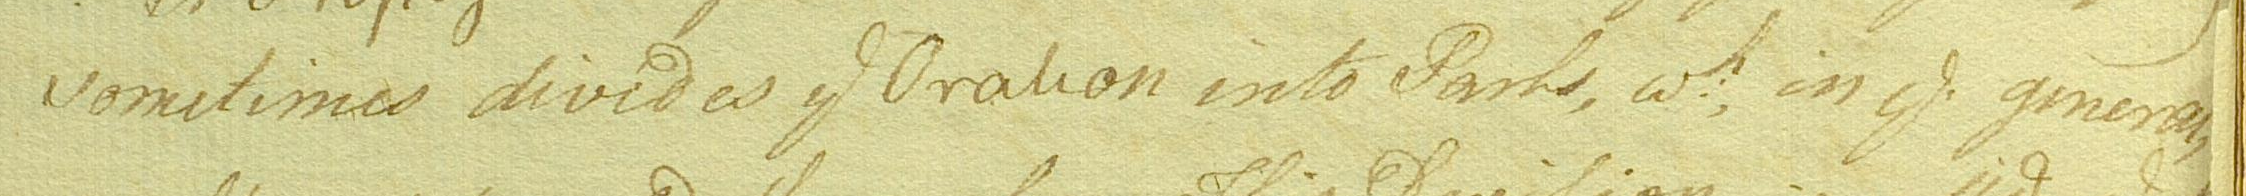sometimes divides y^ Oration into Parts, w^h in y^e general,
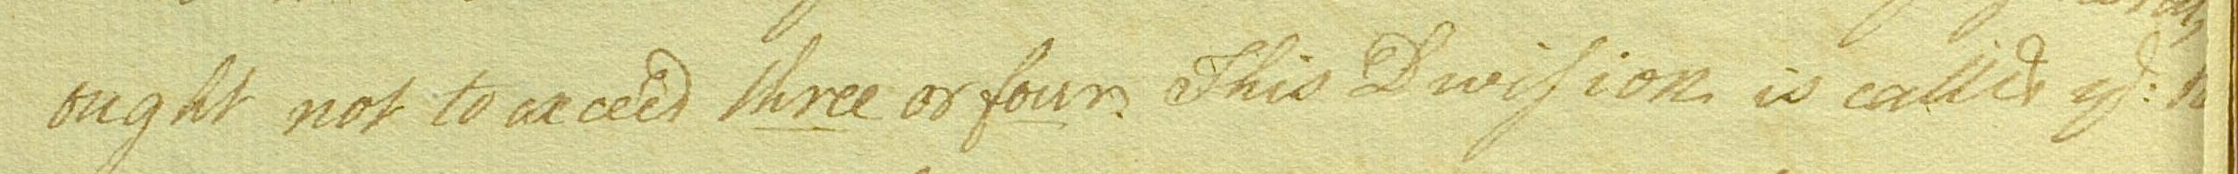ought not to exceed three or four. This Division is called y^e: [__]
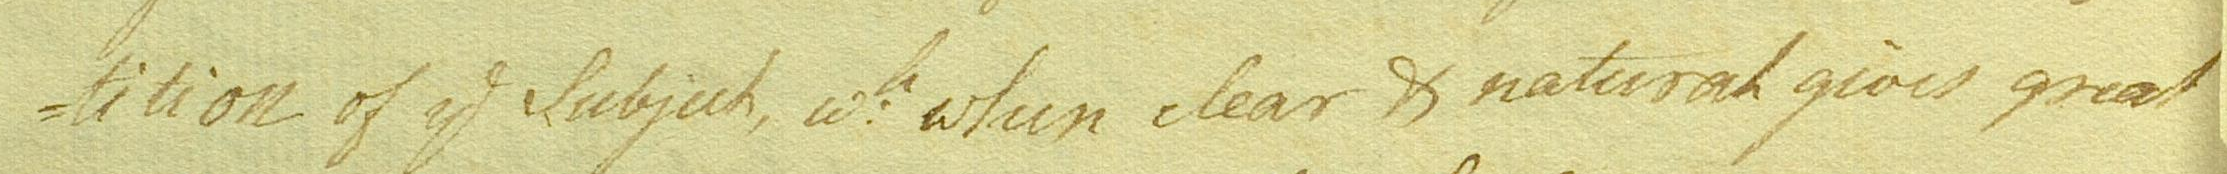-tition of y^e Subject, w^h: when clear & natural gives great
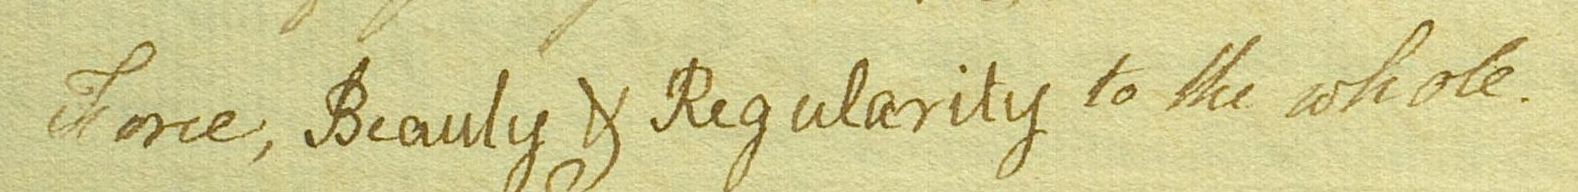Force, Beauty & Regularity to the whole.
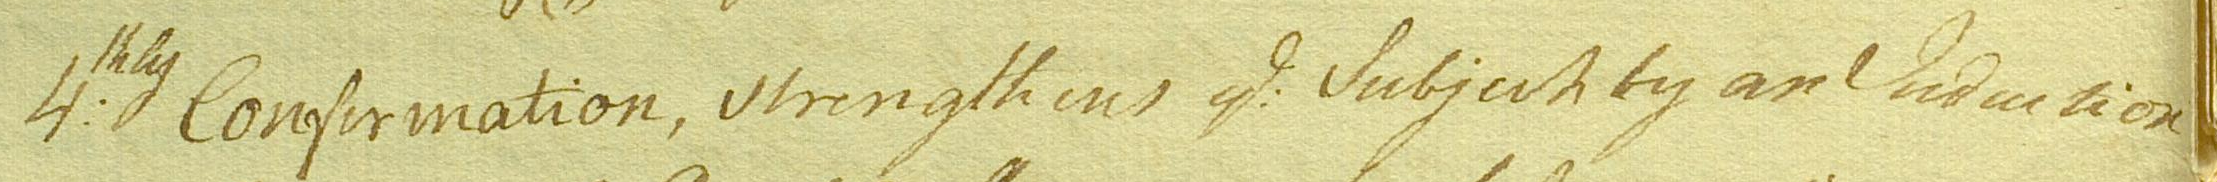4^thly: Confirmation, strengthens y^e Subject by an Induction
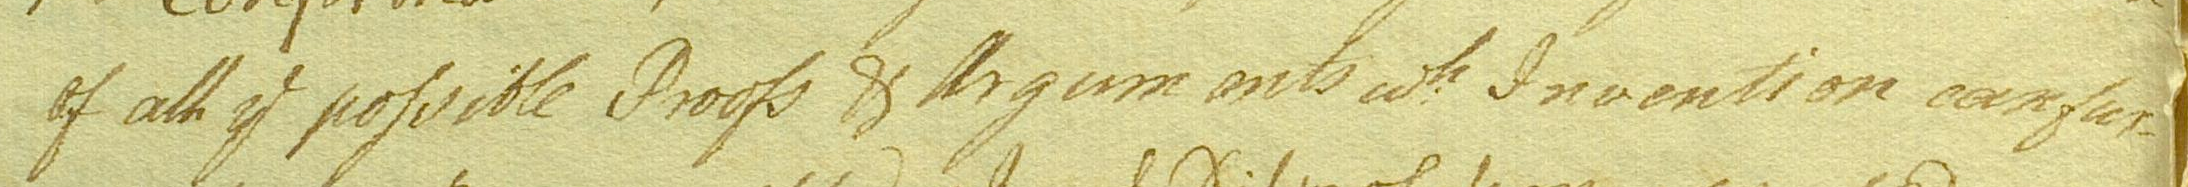of all y^e possible Proofs & Arguments w^h Invention can fur-
